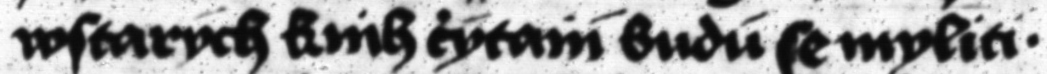wſtarých knih ċýtaṅí budú se myliti.
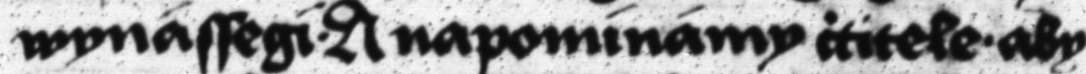wynaſſegí. A napomínámy ċtitele. aby
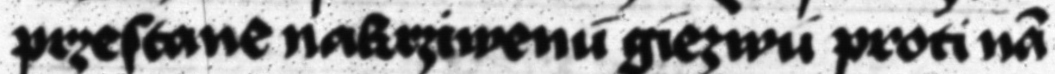przeſtane nabkrziwenú gíezwú proti nā
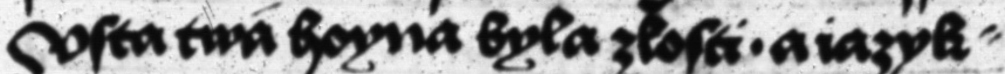Vſta twá hoyna byla zloſti. a iazyk
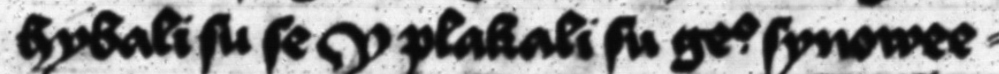hýbali ſu ſe Y plakali ſu ge° ſynowee
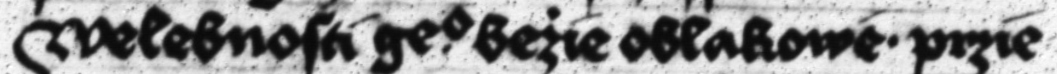Welebnosti ge° beżíe oblakowé. przíe
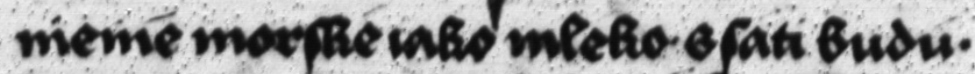nieṅíe morſke iako mleko sſati budú.
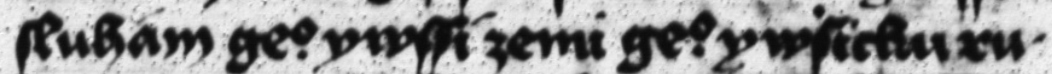ſluhám ge° ywſſí zemi ge° y wẛicku ru
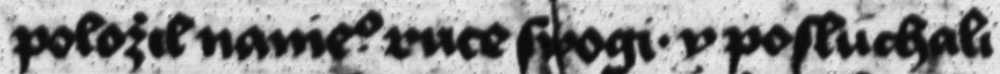položil nanie° ruce ſwogi. y poſlúchali
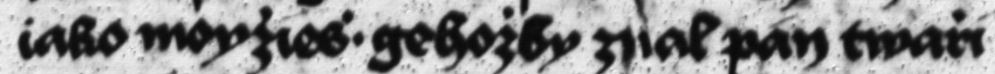iako moyżíeṡ. gehożby znal pán twaṙí
